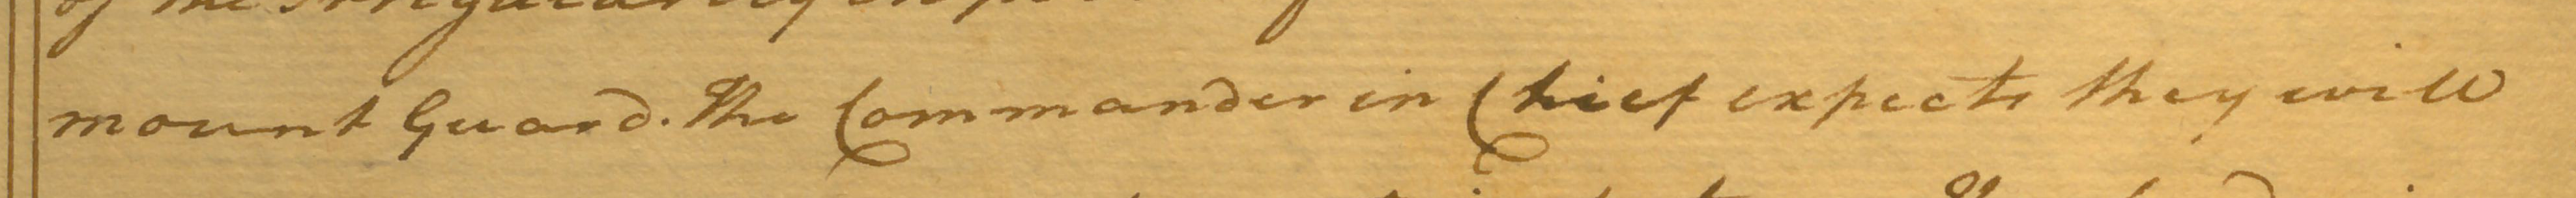mount Guard. The Commander in Chief expects they will
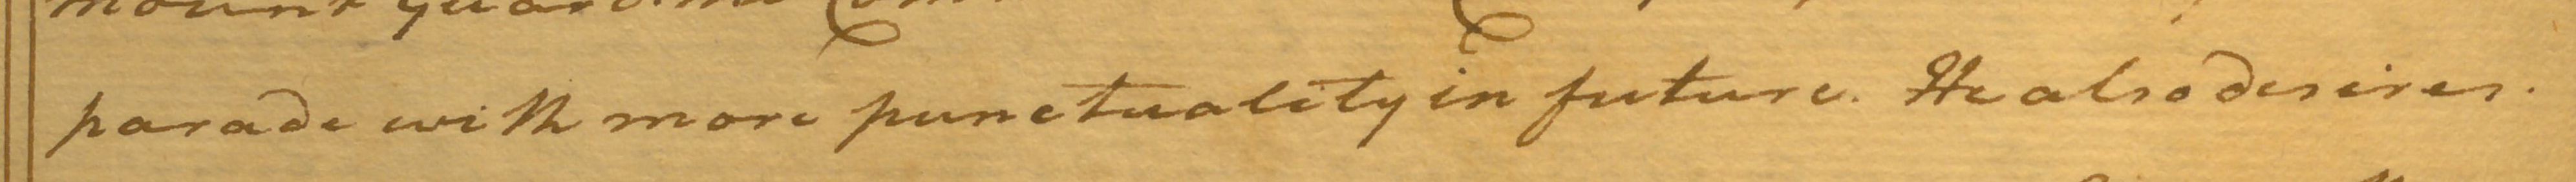parade with more punctuality in future. He also desires
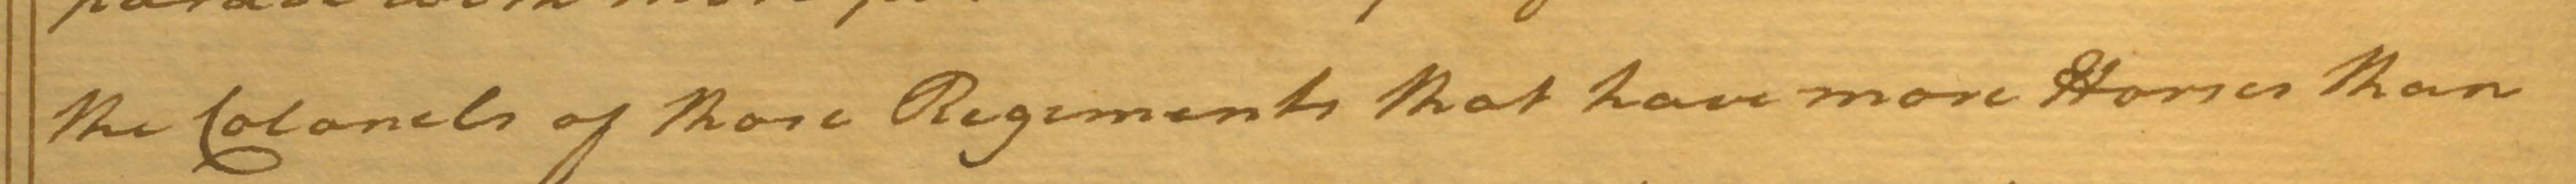the Colonels of those Regiments that have more Horses than
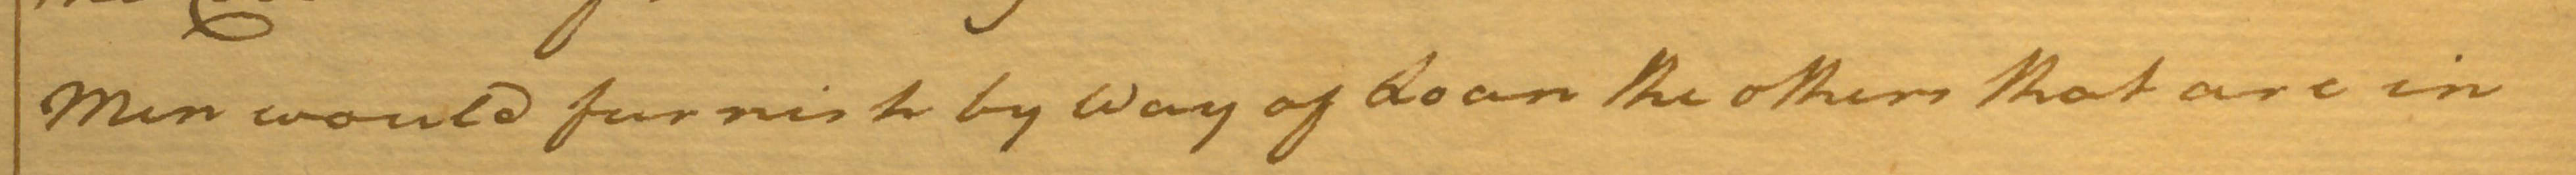Men would furnish by Way of Loan the others that are in
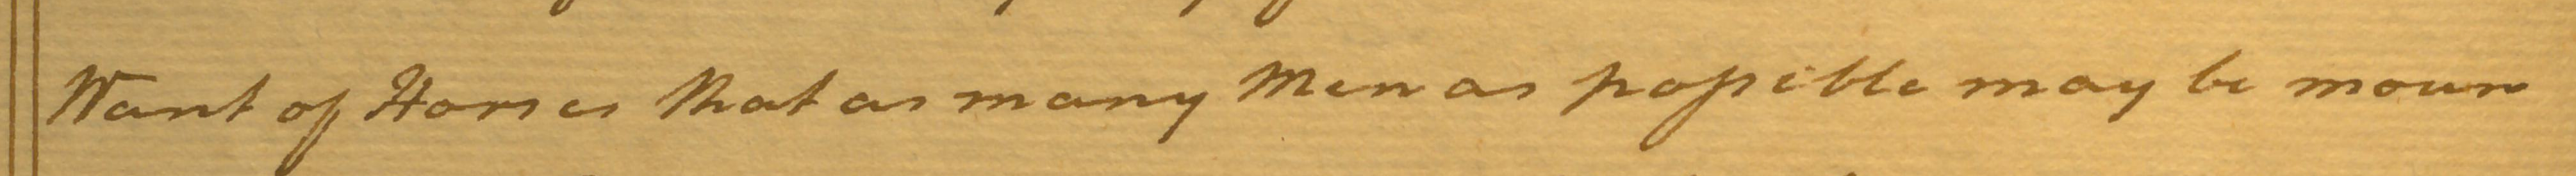Want of Horses that as many Men as possible may be moun
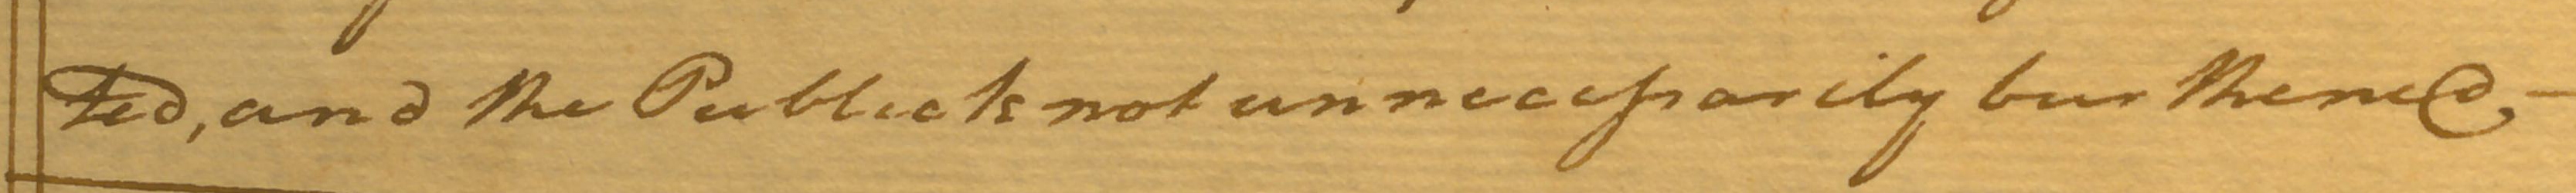ted, and the Publick not unnecessarily burthened-
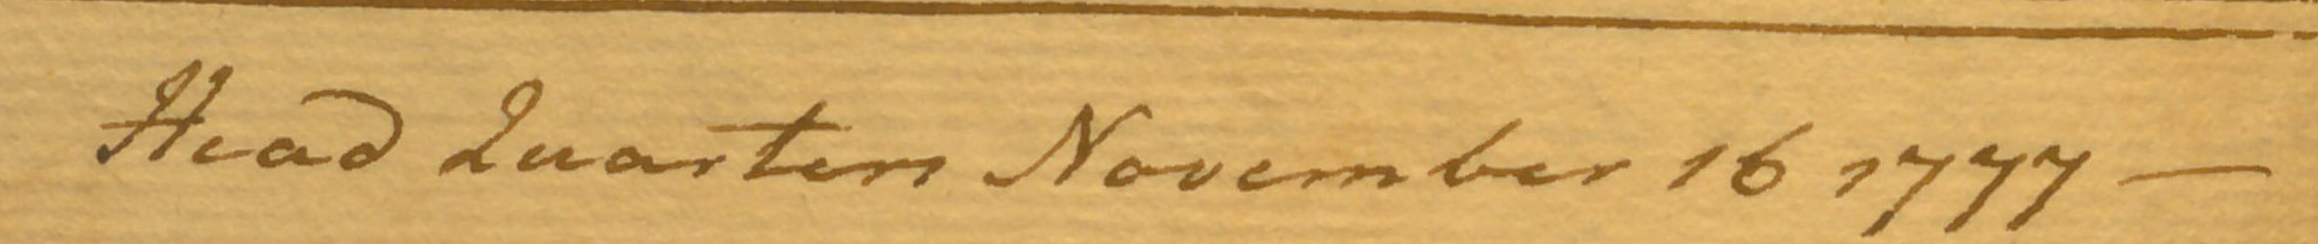Head Quarters November 16 1777-
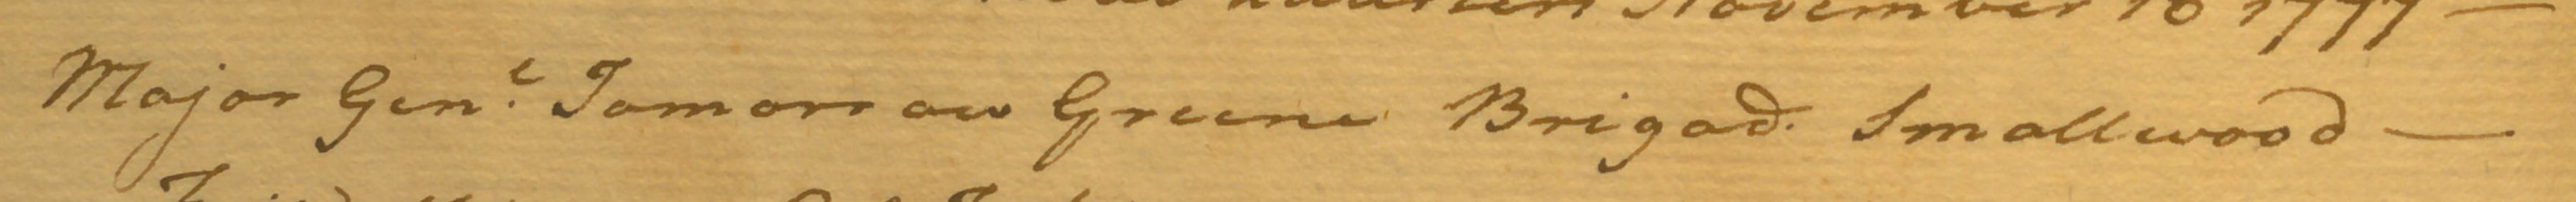Major Gen^l. Tomorrow Greene Brigad. Smallwood-
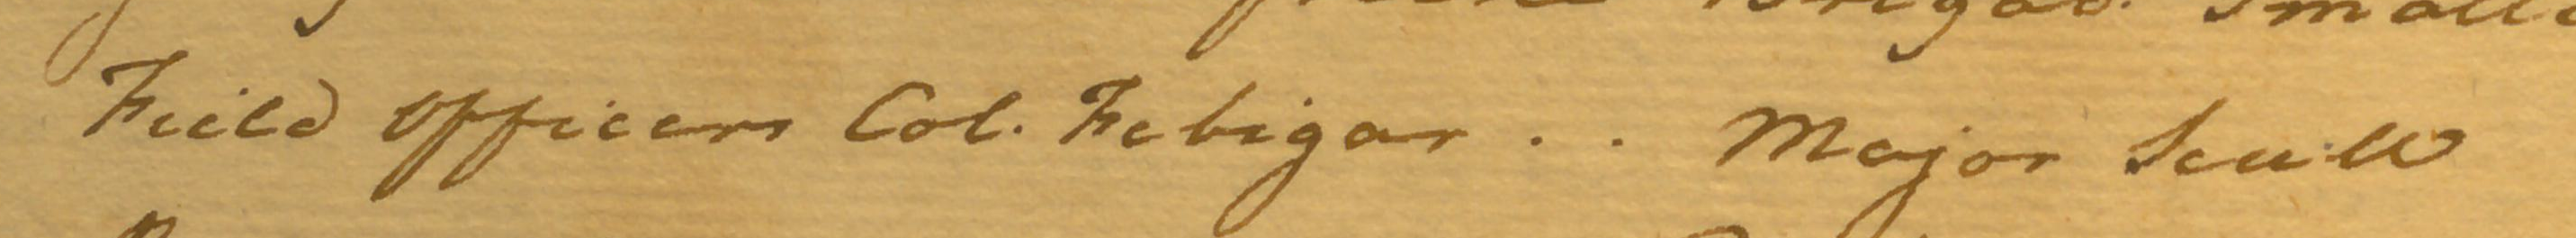Field Officers Col. Febigar .. Major Scull
